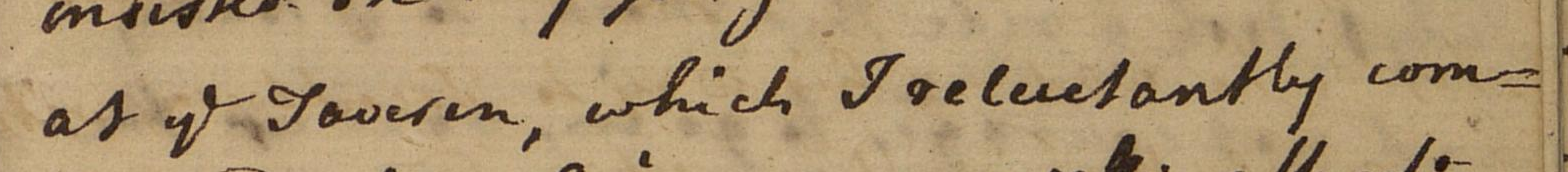at y^e Tavern, which I reluctantly com-
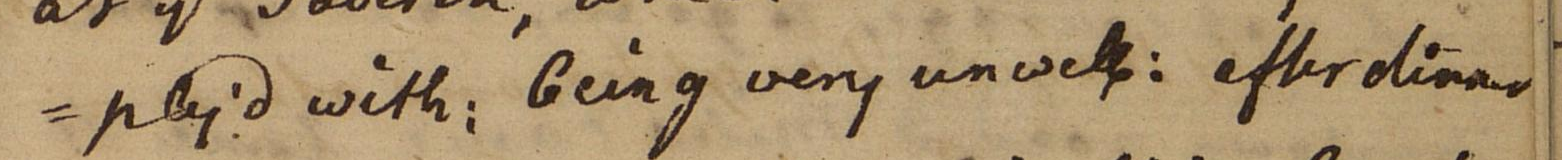-ply'd with, being very unwell: after dinner
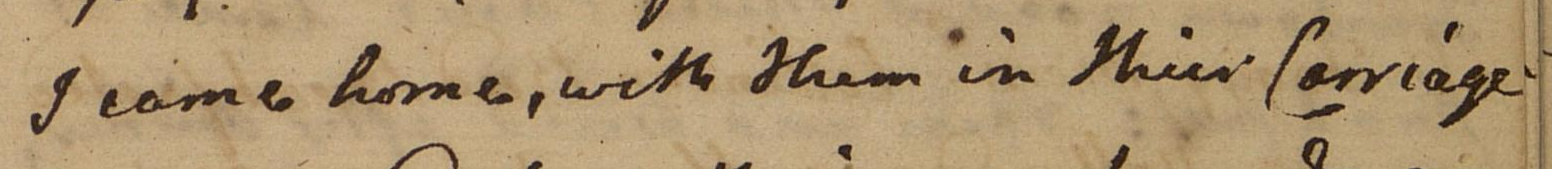I came home, with them in their Carriage
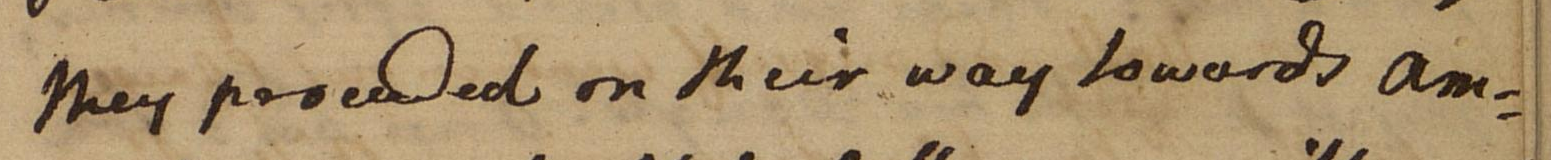they proceeded on their way towards am-
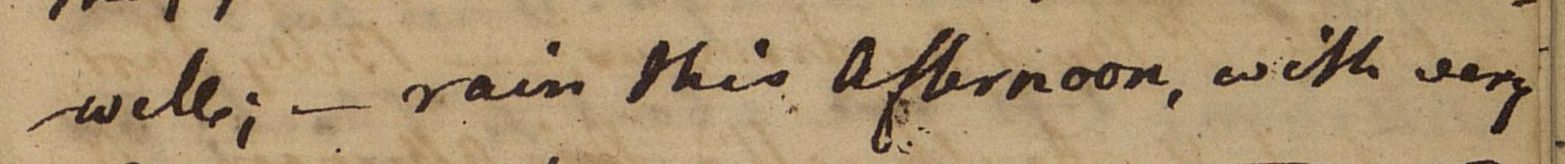-well;- rain this Afternoon with very
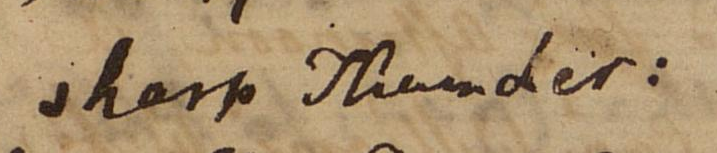sharp Thunder:
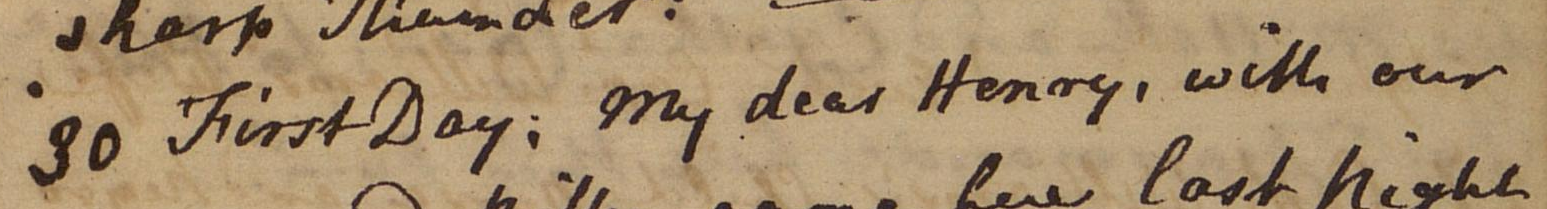30 First Day; My dear Henry, with our
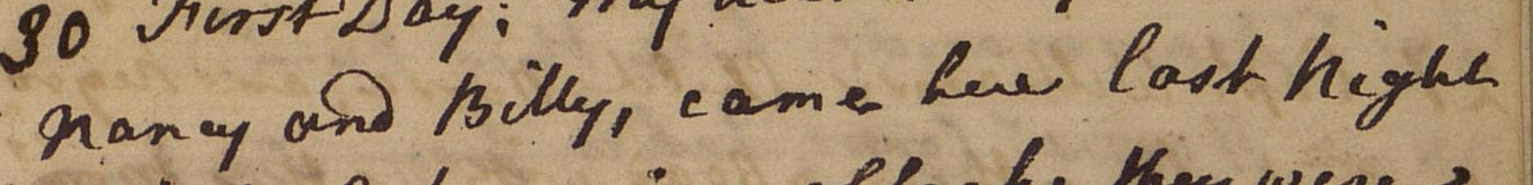Nancy and Billy, came here last Night
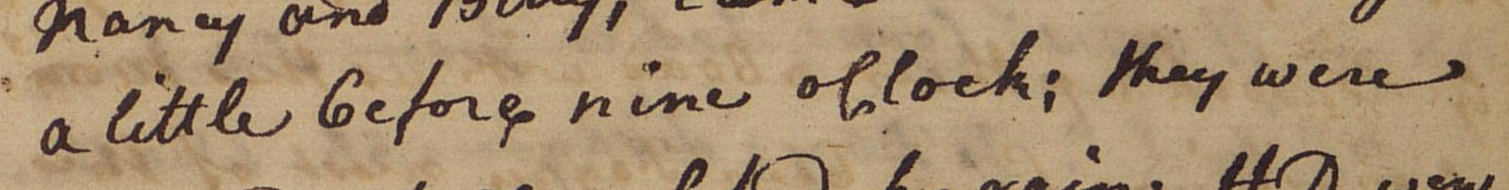a little before nine ^o Clock; they were
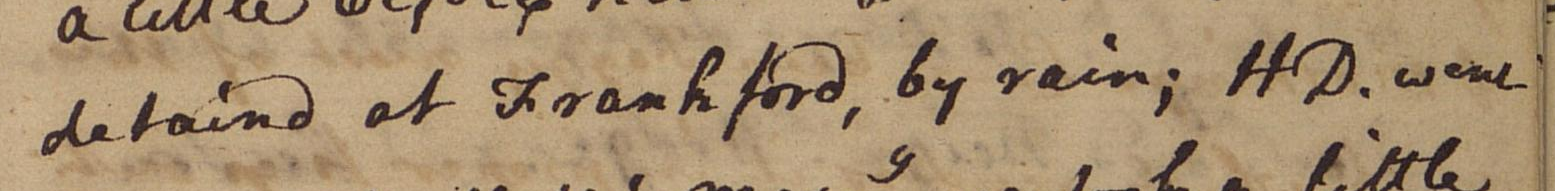detaind at Frankford, by rain; HD. went
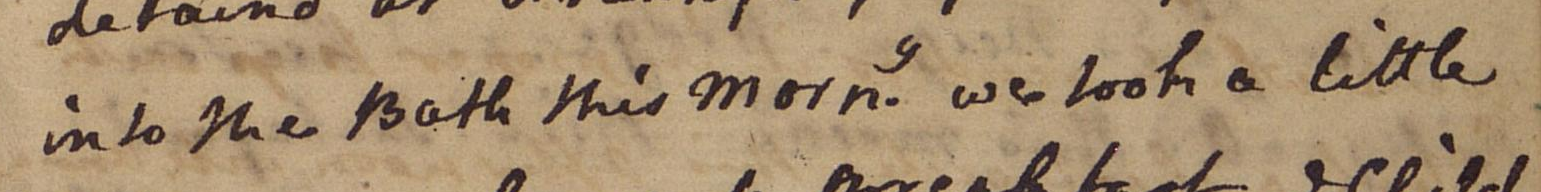in to the Bath this morn^g. we took a little
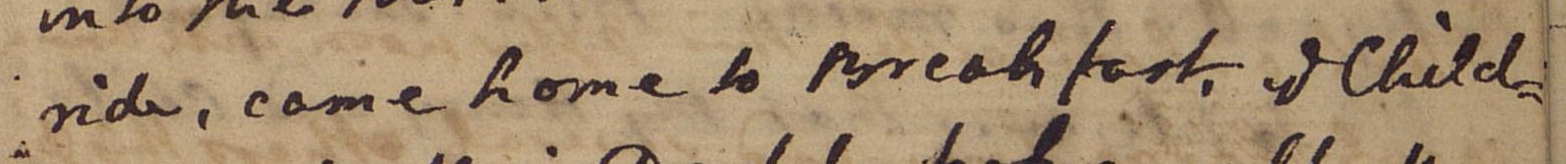ride, came home to Breakfast, y^e Child-
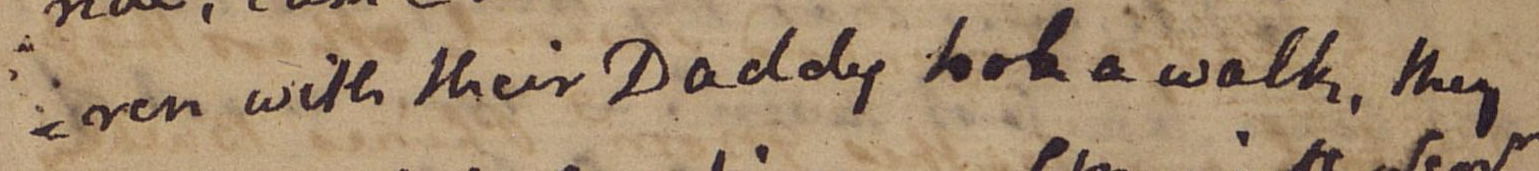-ren with their Daddy took a walk, they
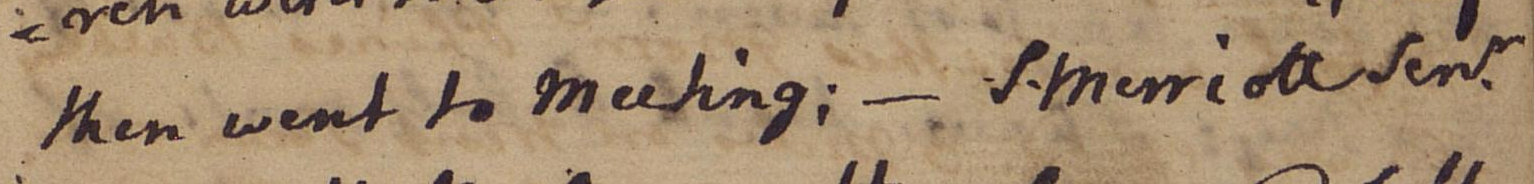then went to meeting;- S. Merriott Sen^r.
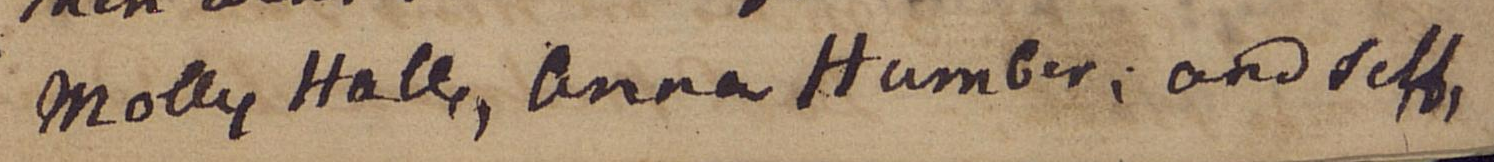Molly Hall, Anna Humber; and self,
